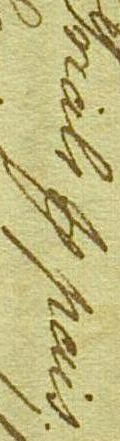Trials & pais.
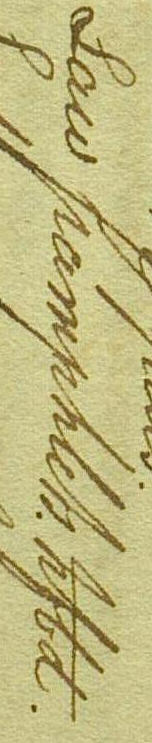Law pamphlets. hftd.
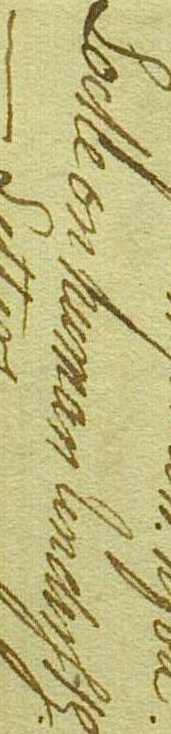Locke on human understg
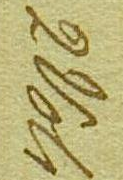2 Vols
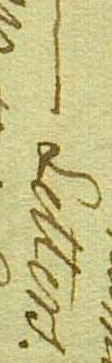--- Letters.
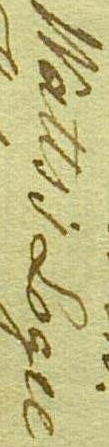Watts's Logic
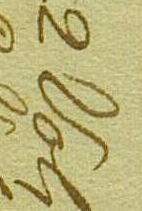2 Vols
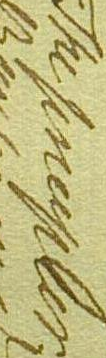The Precepter
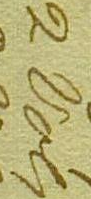2 Vols
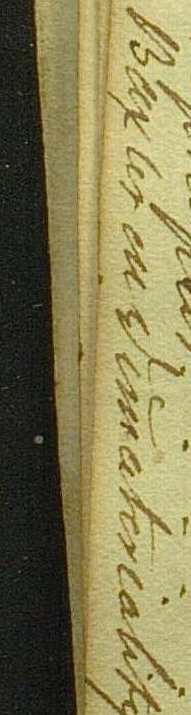Baxter on immateriality
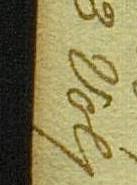3 Vols
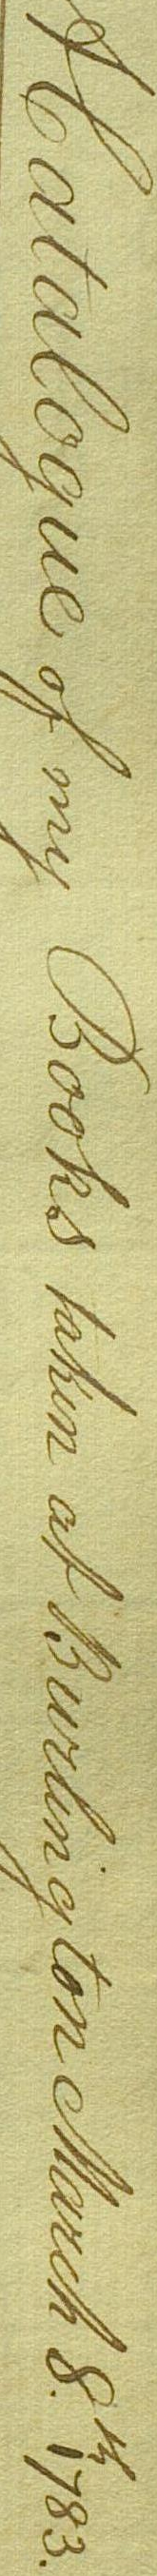A Catalogue of my Books taken at Burlington March 8^th 1783.
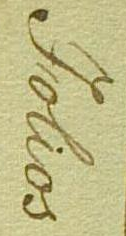Folios
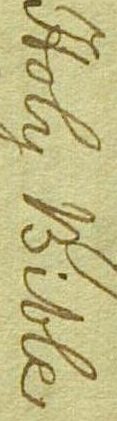Holy Bible
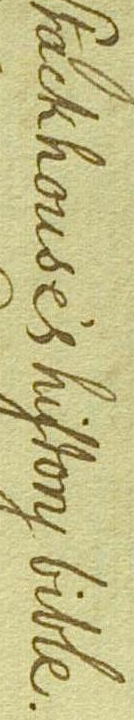Stackhouse's history bible
